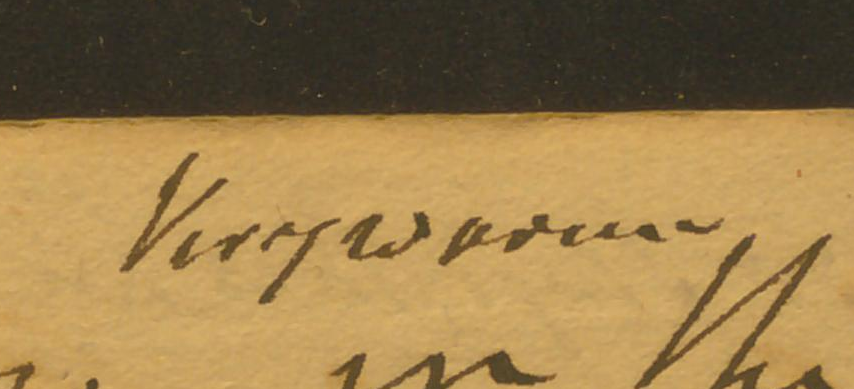Very warm
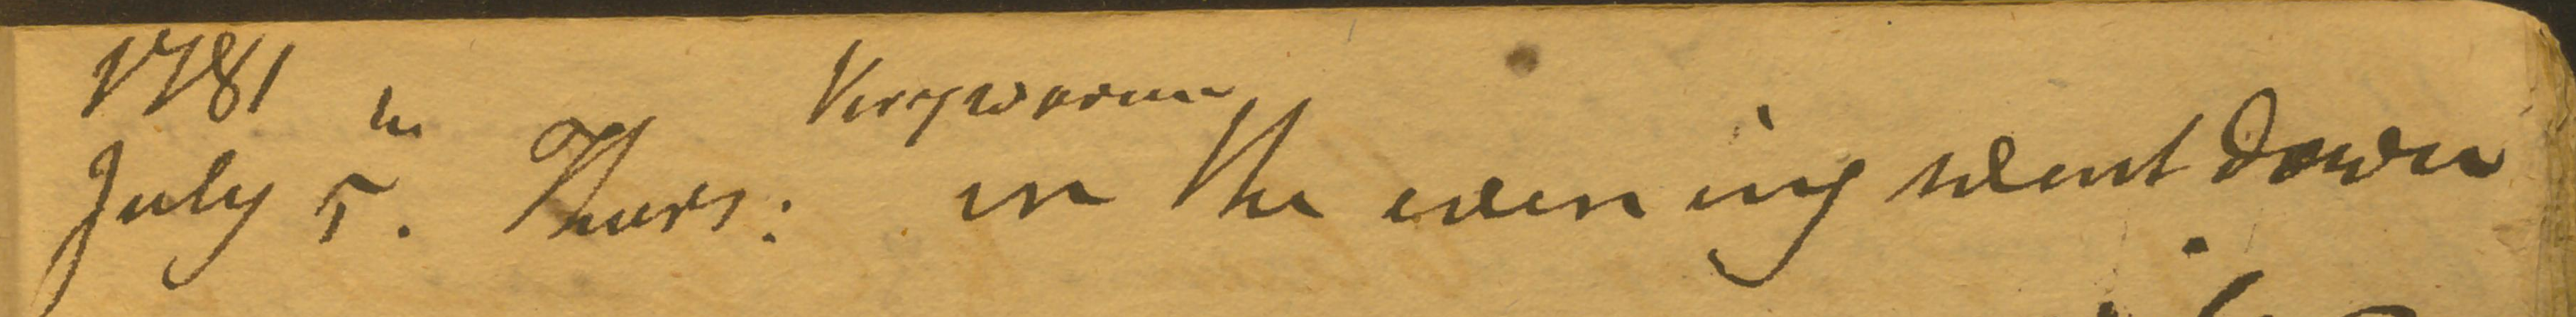July 5^th. Thurs: in the evening went dowe
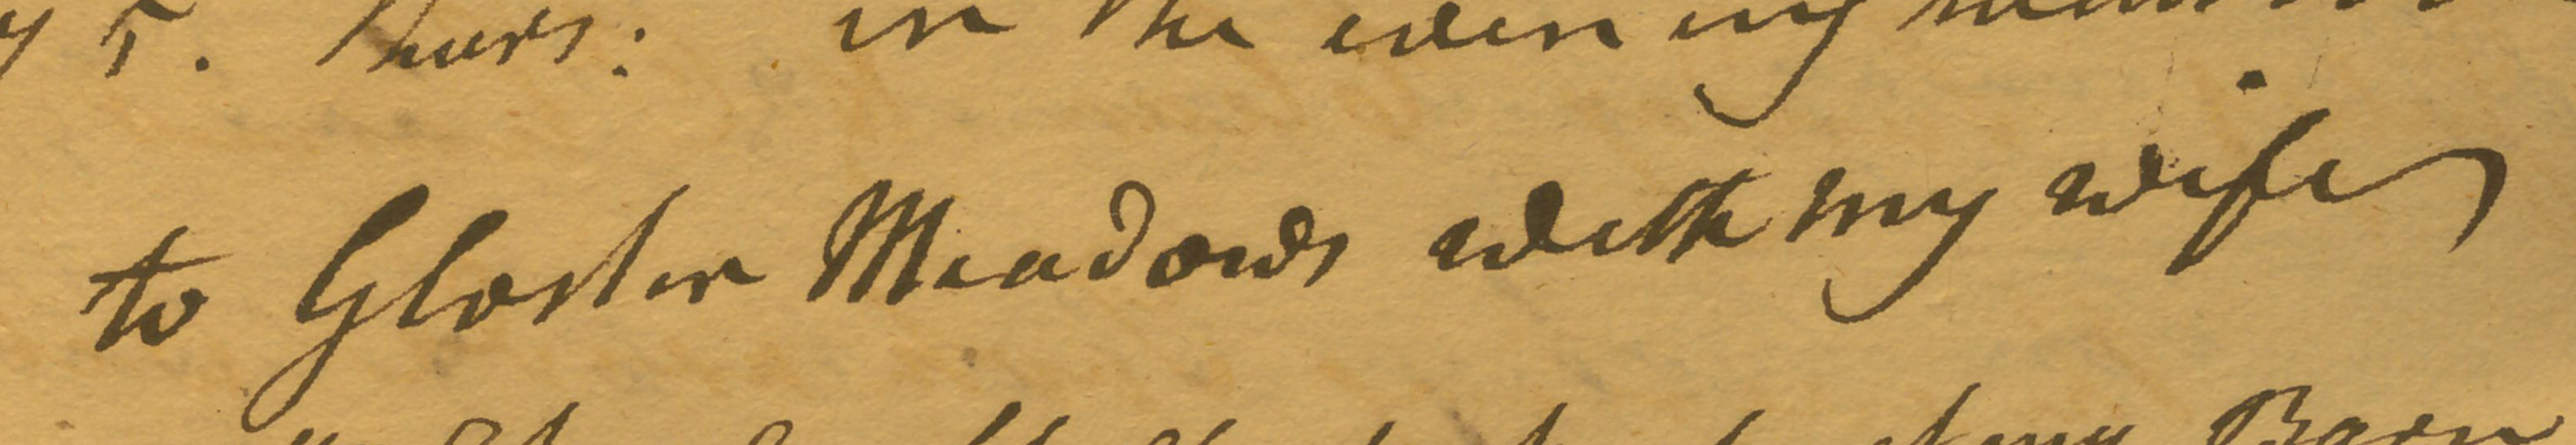to Gloster Meadows with my wife
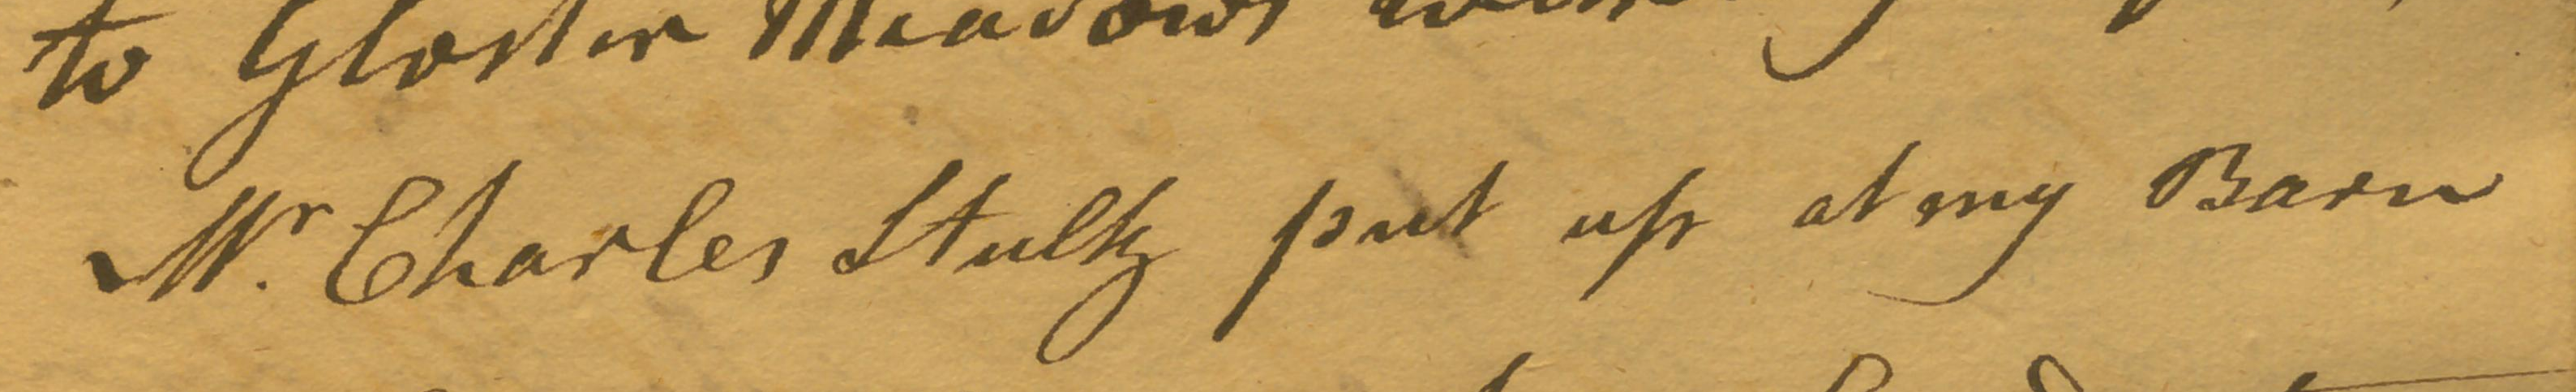M^r. Charles Stultz put up at my Barn
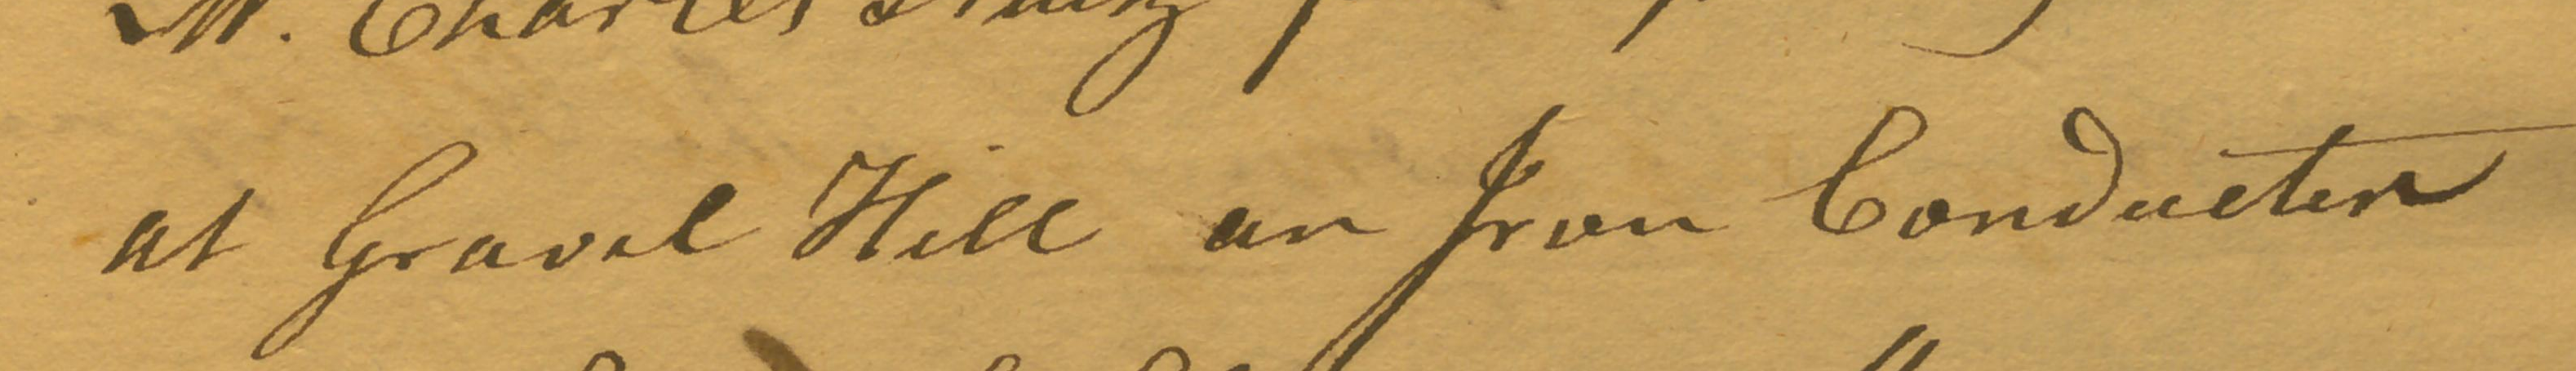at Gravel Hill an Iron Conducter
